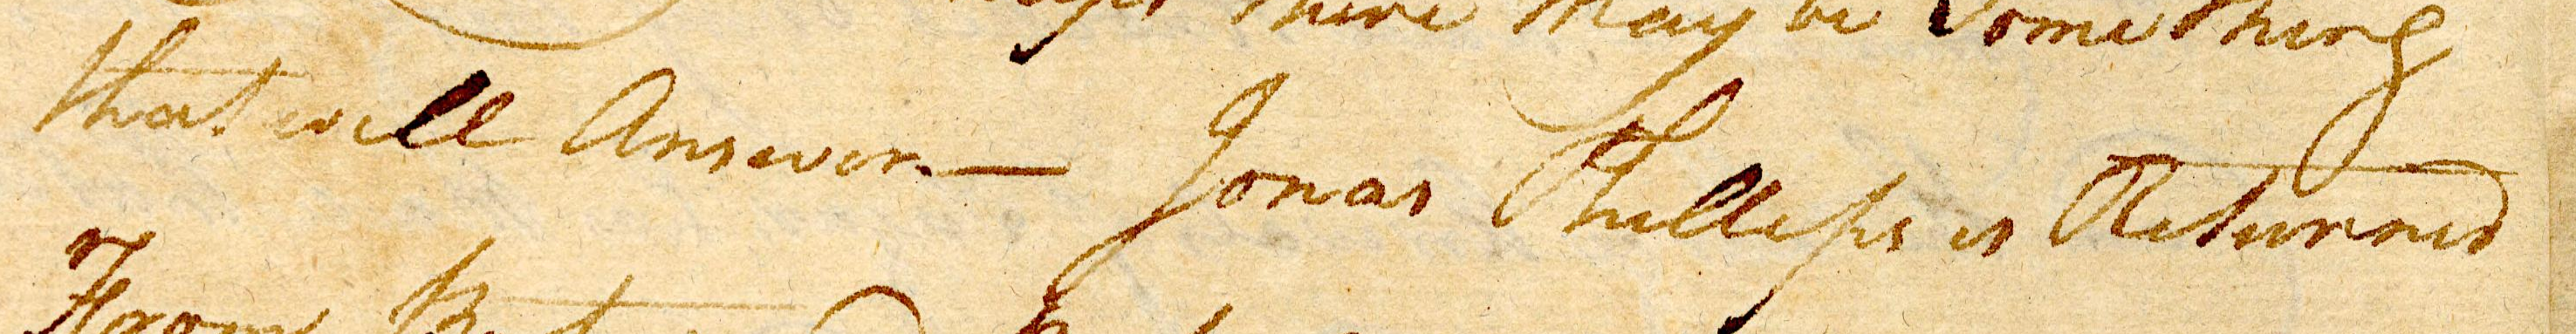that will answer.- Jonas Phillips is Returned
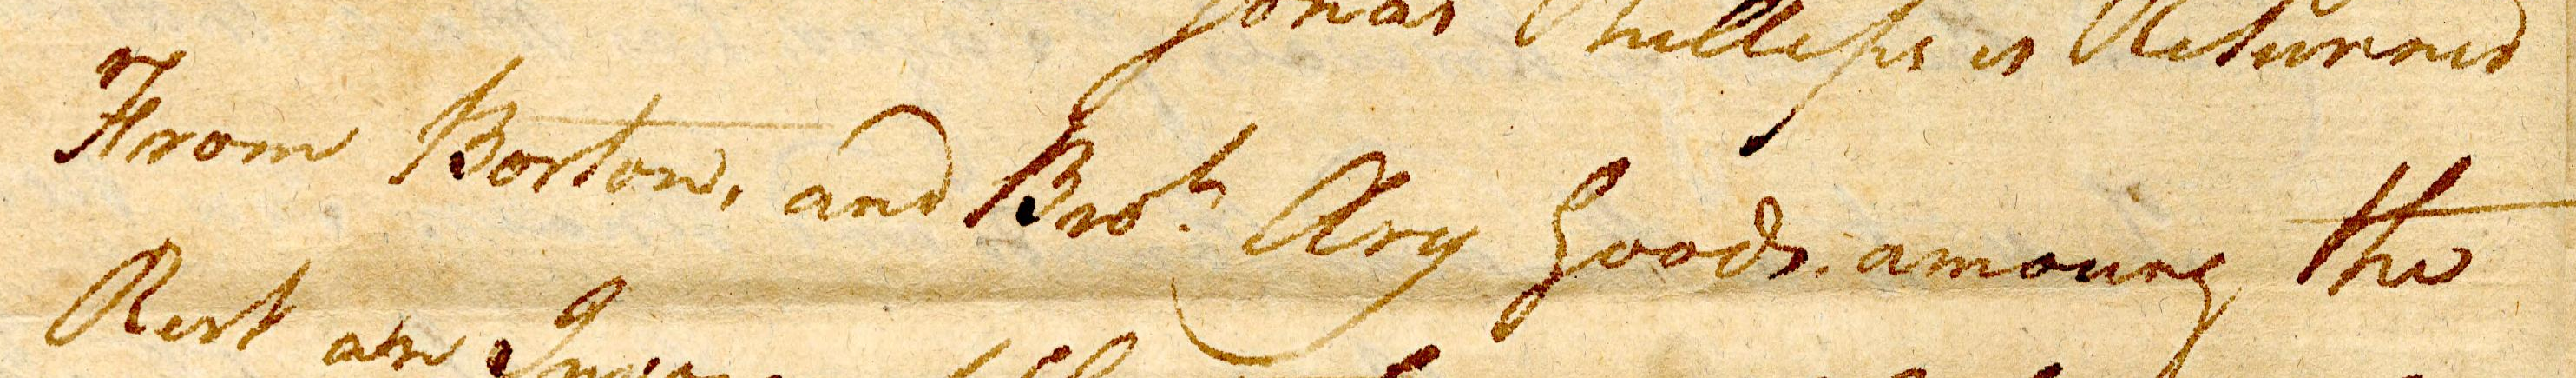From Boston, and Bro^t. Dry Goods amoung the
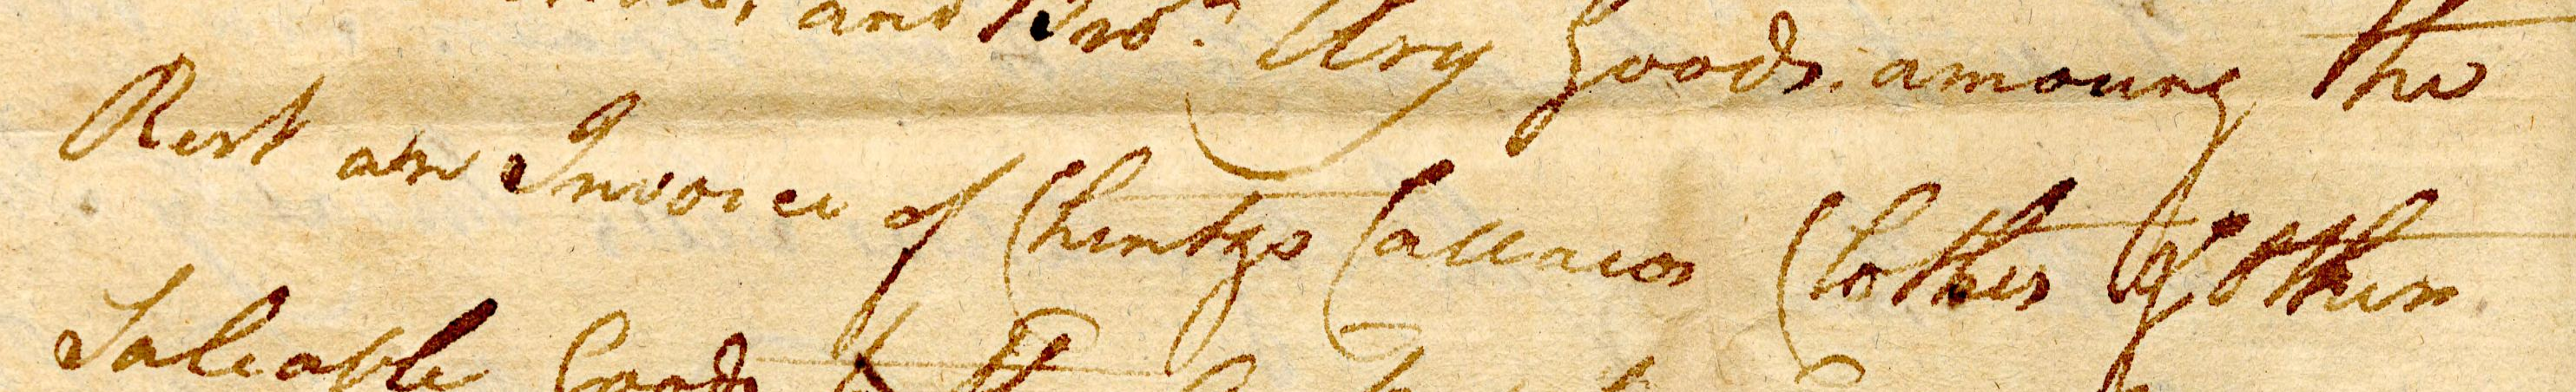Rest an Invoice of Chintz Callacoes clothes & other
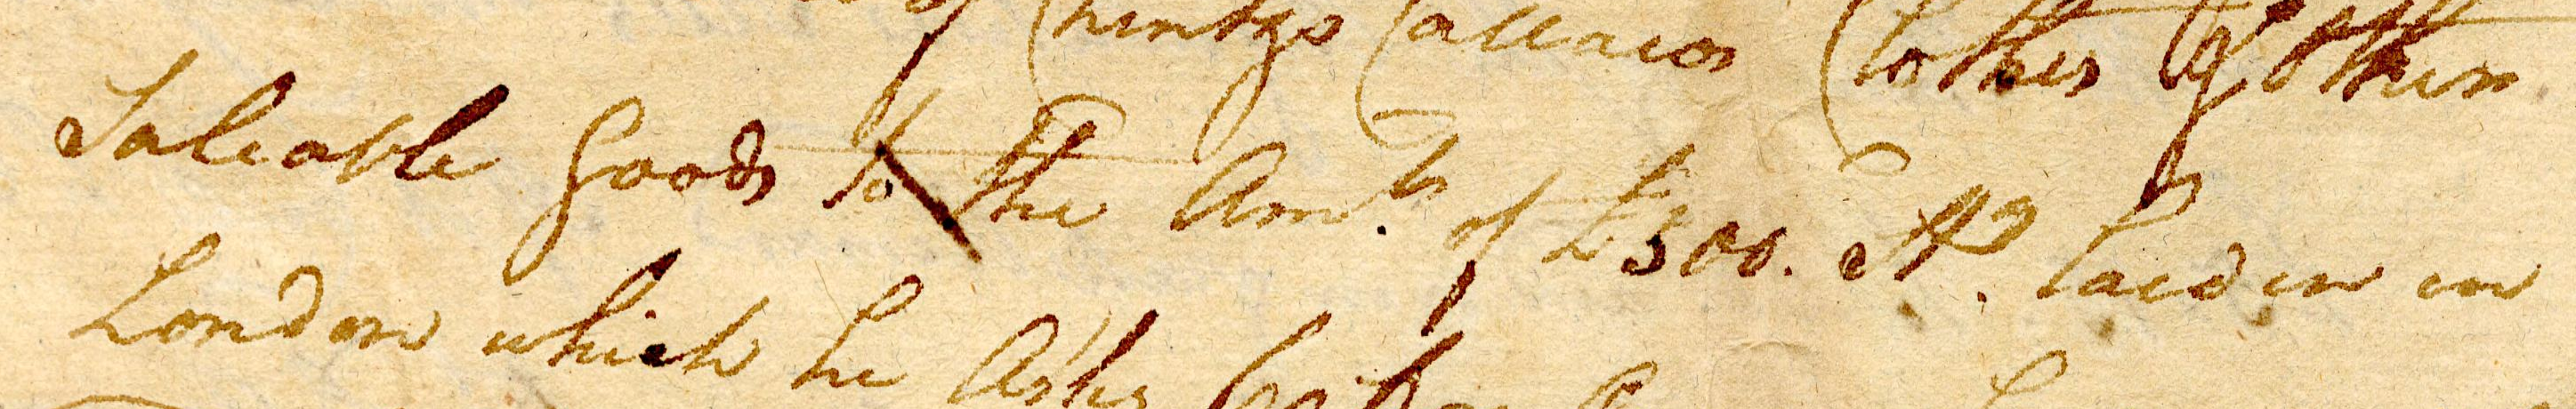saleable goods to the Am^t. of £500 H^g. Paid in in
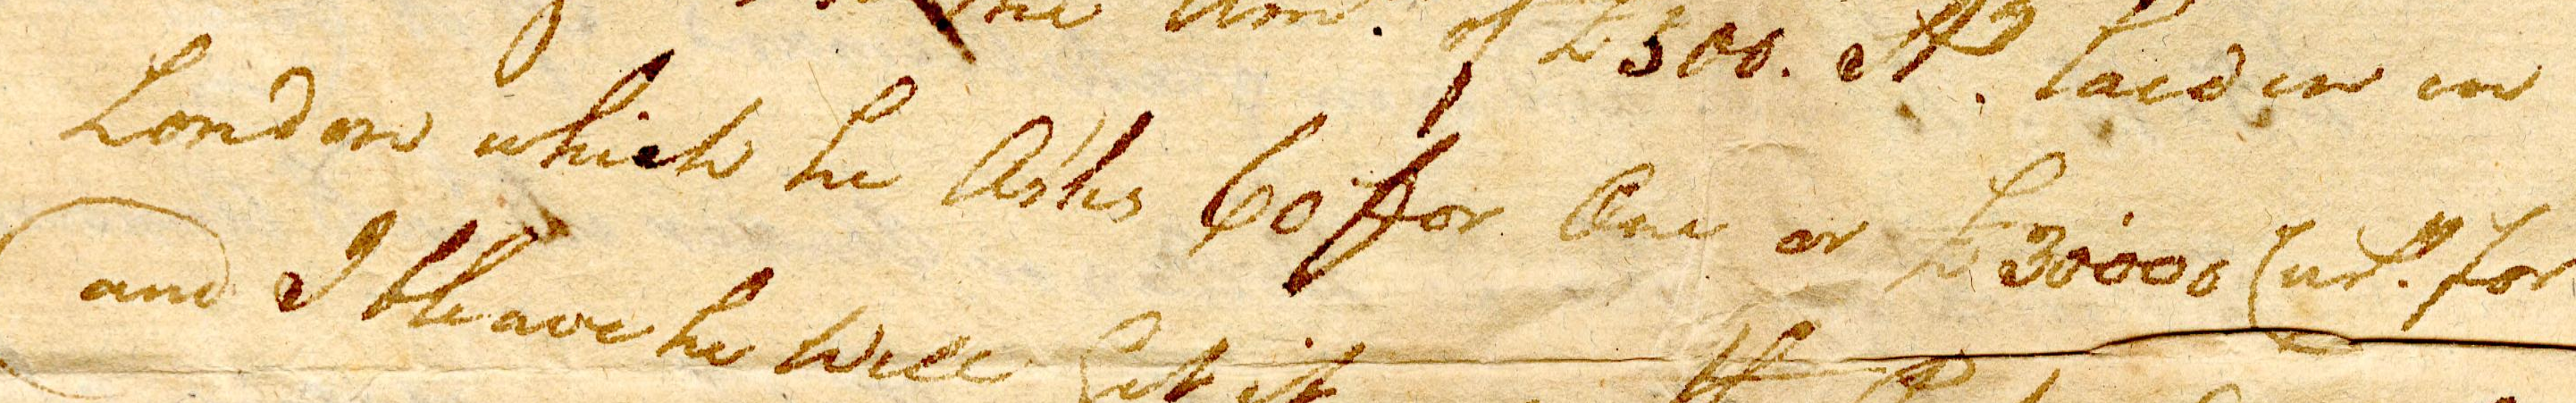London which he asks 60 for One or £30'000 Cur^y. for
